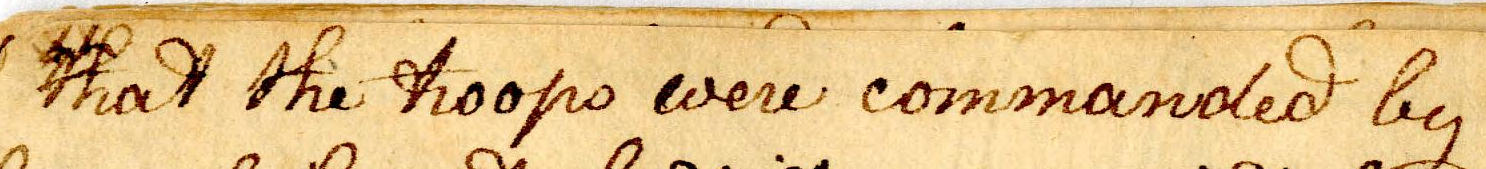that the troops were commanded by
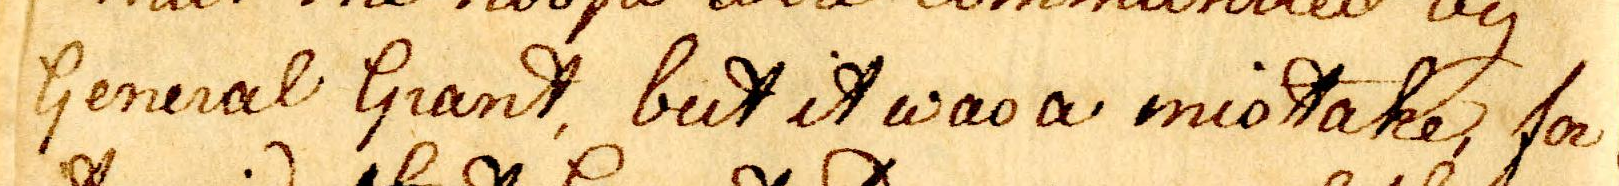General Grant, but it was a mistake, for
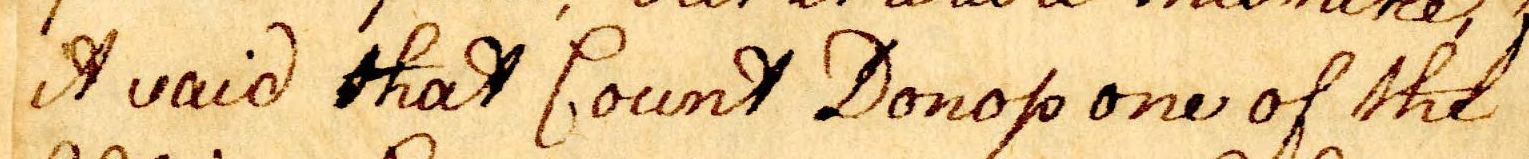it said that Count Donopone of the
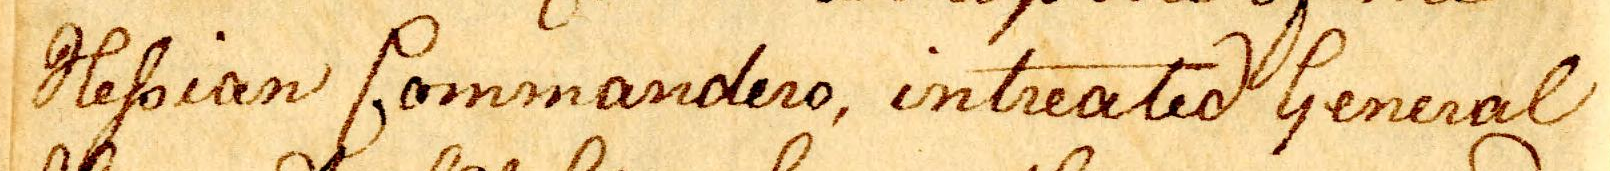Hessian Commanders, intreated General
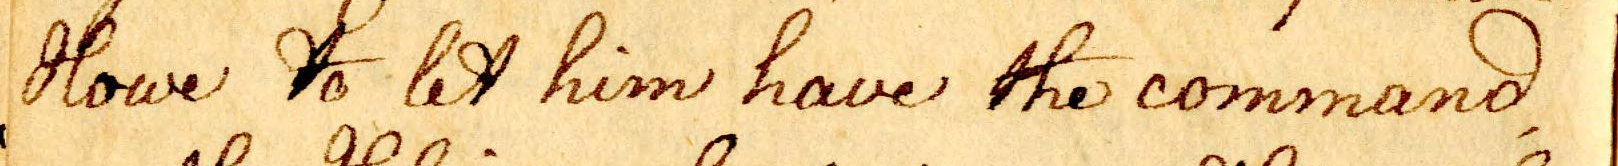Howe to let him have the command
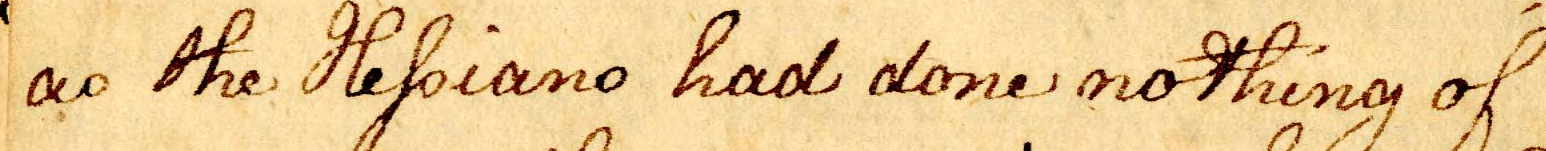as the Hessians had done nothing of
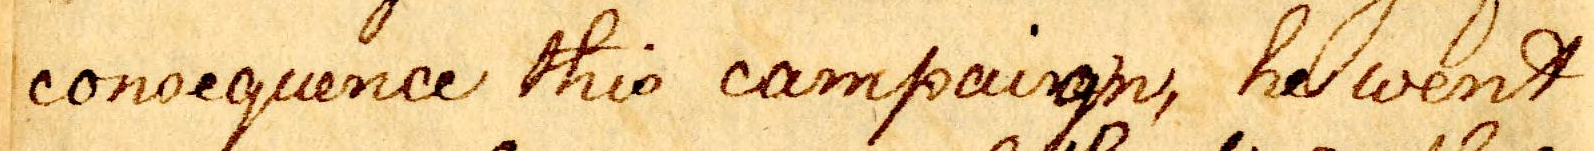consequence this campaign, ha went
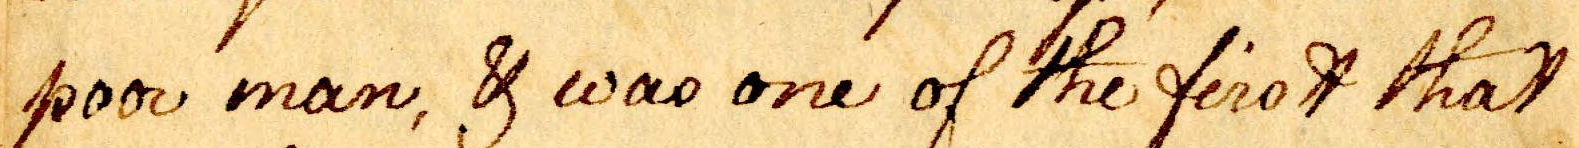poor man, & was one of the first that
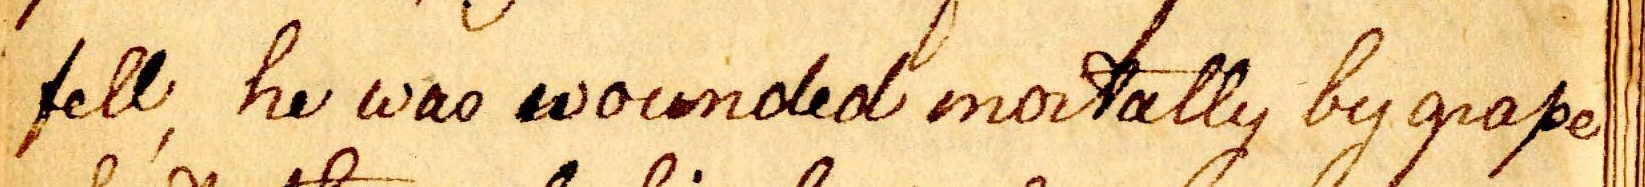fell, he was wounded mortally by grape
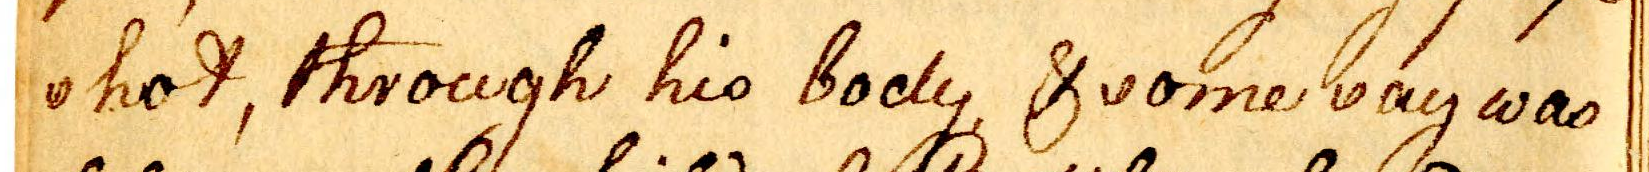shot, through his body, & some say was
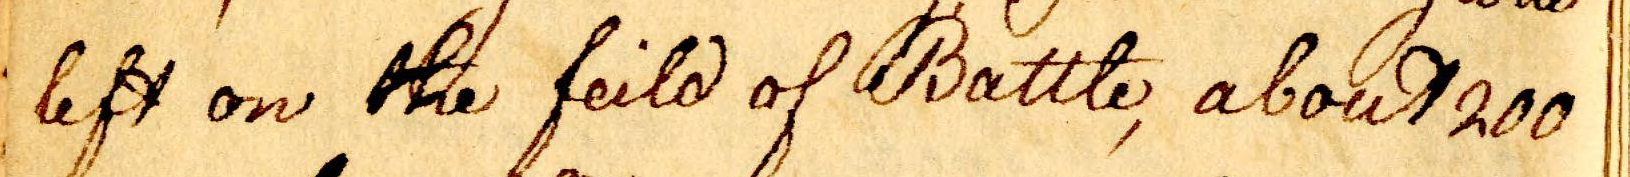left on the feild of Battle, about 200
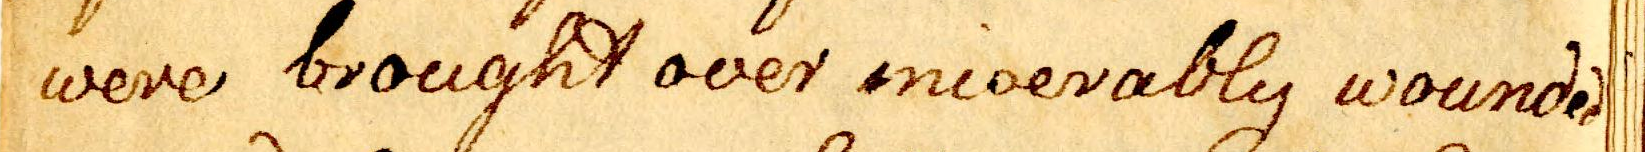were brought over miserably wounded
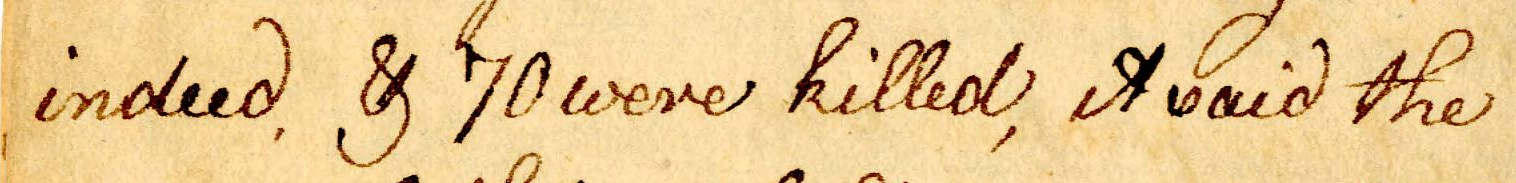indeed & 70 were killed it said the
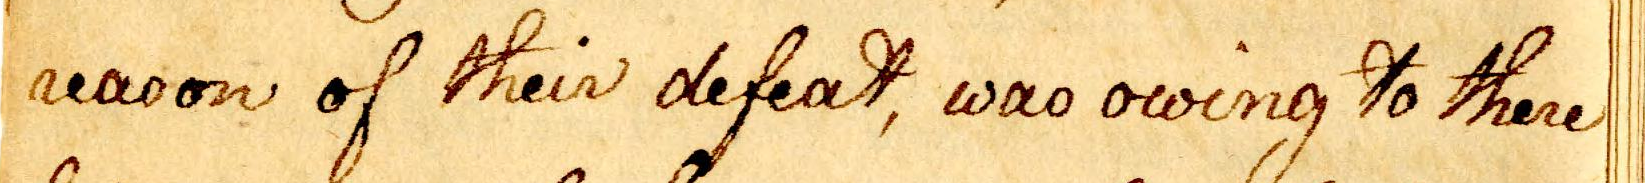reason of their defeat, was owing to there
